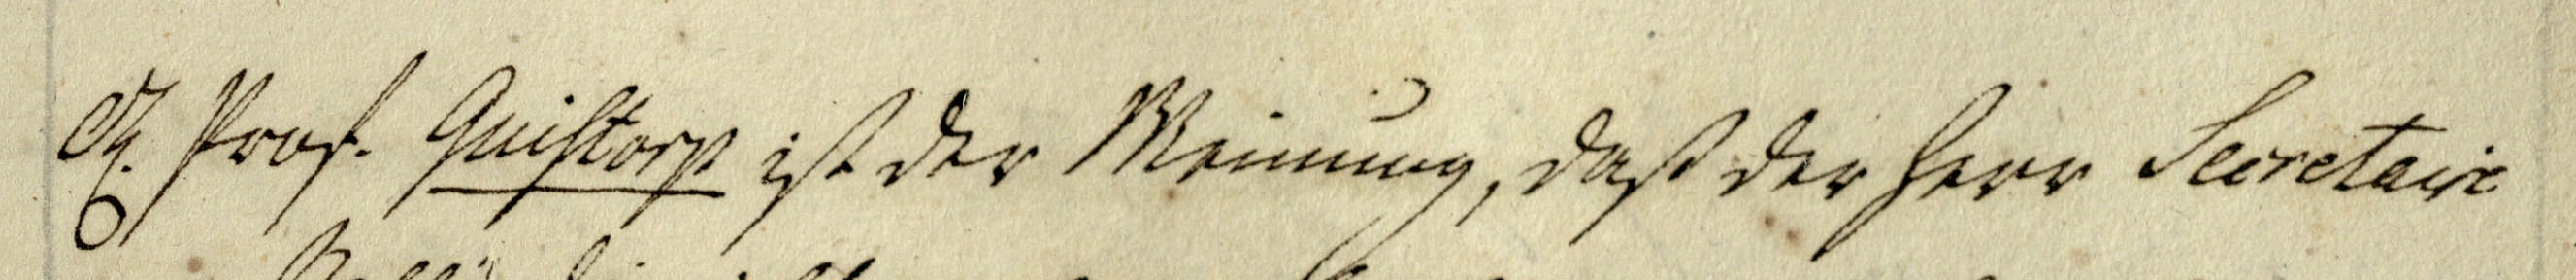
dh. Prof. Quistorp ist der Meinung, daß der Herr Secretaire
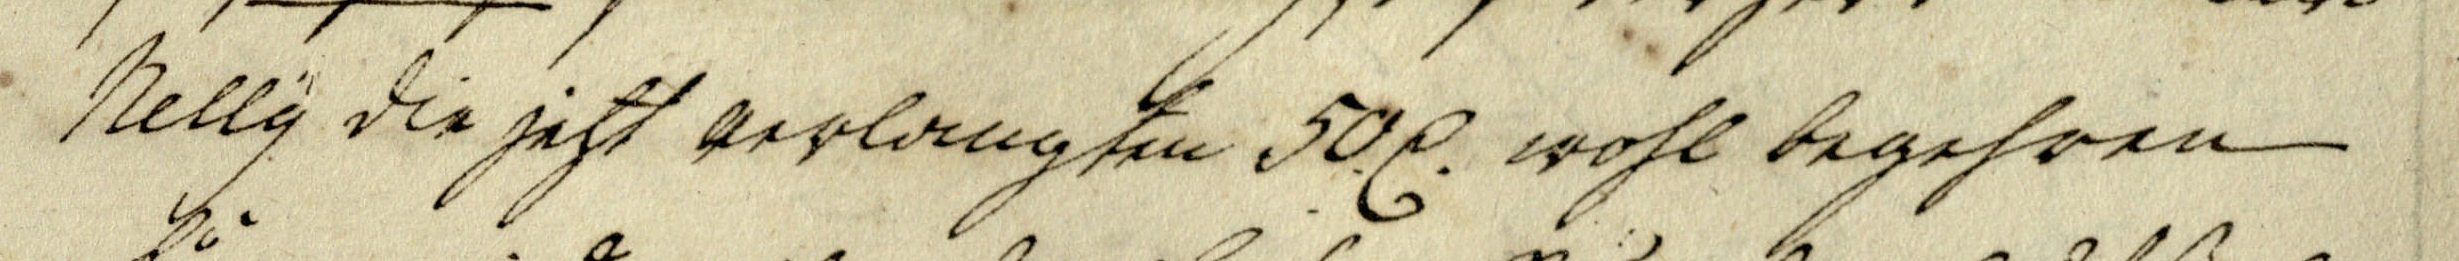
Nellÿ die jetzt verlangten 50 l. wohl begehren
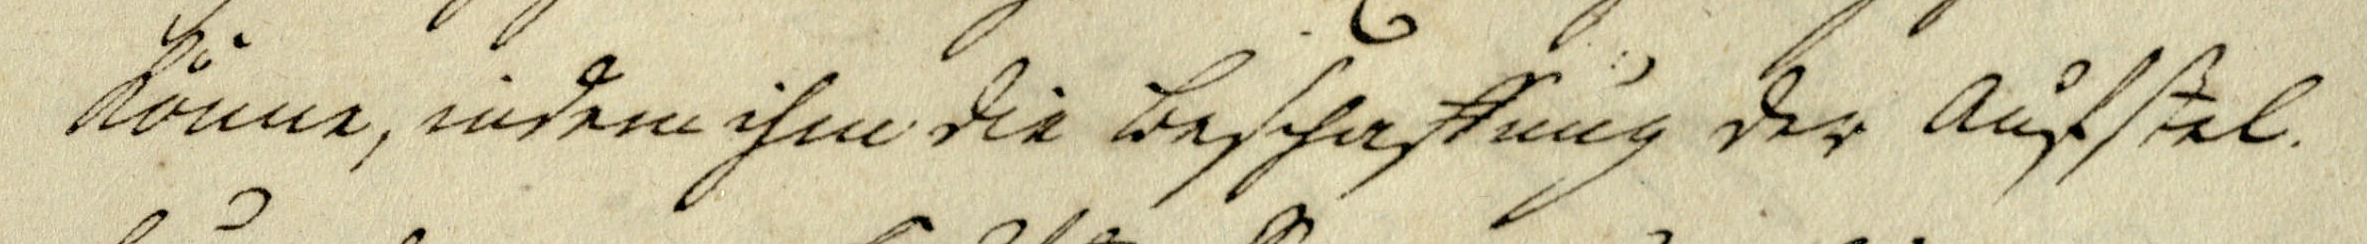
könne, indem ihm die Beschaffung der Aufstel¬
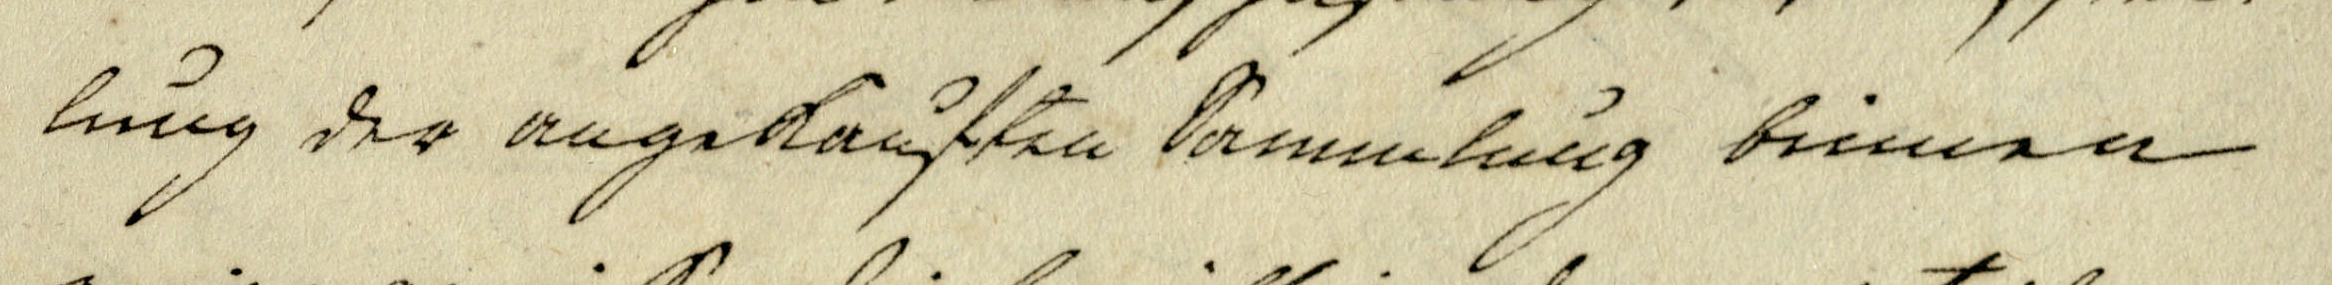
lung der angekauften Sammlung binnen
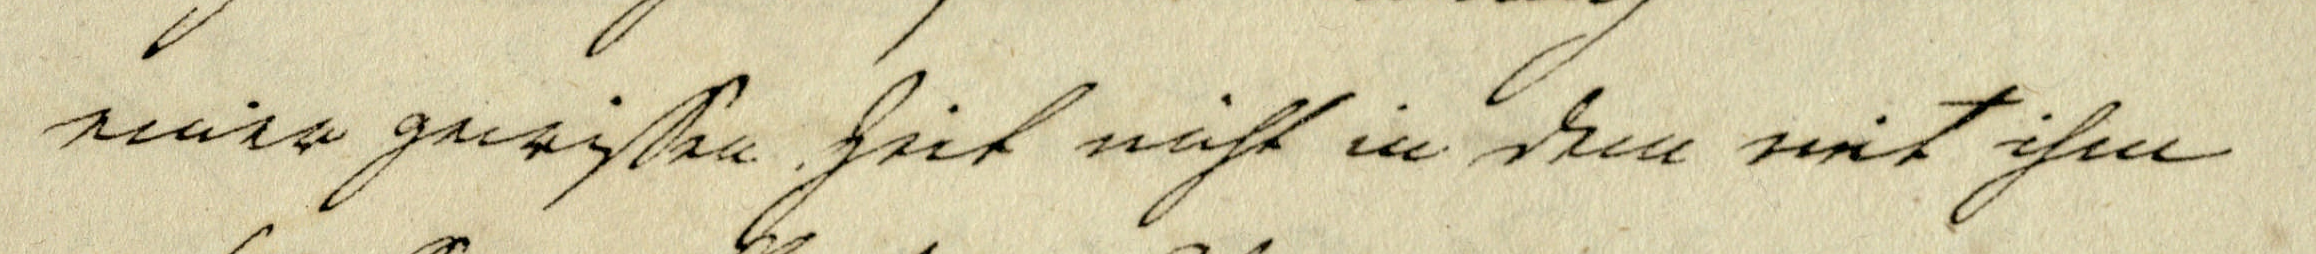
einer gewissen Zeit nicht in dem mit ihm
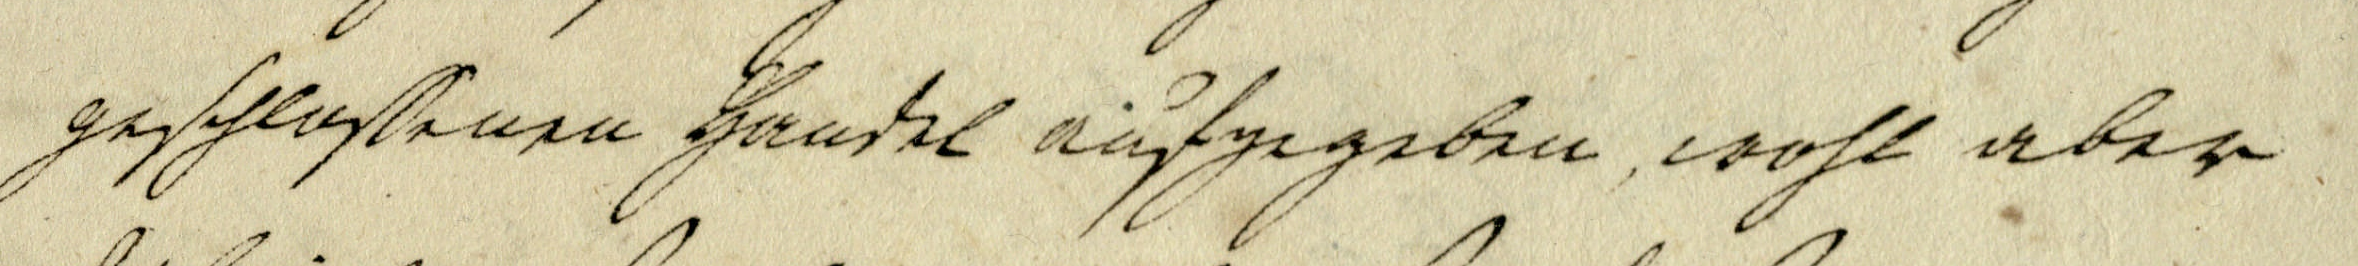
geschlossenen Handel aufgegeben, wohl aber
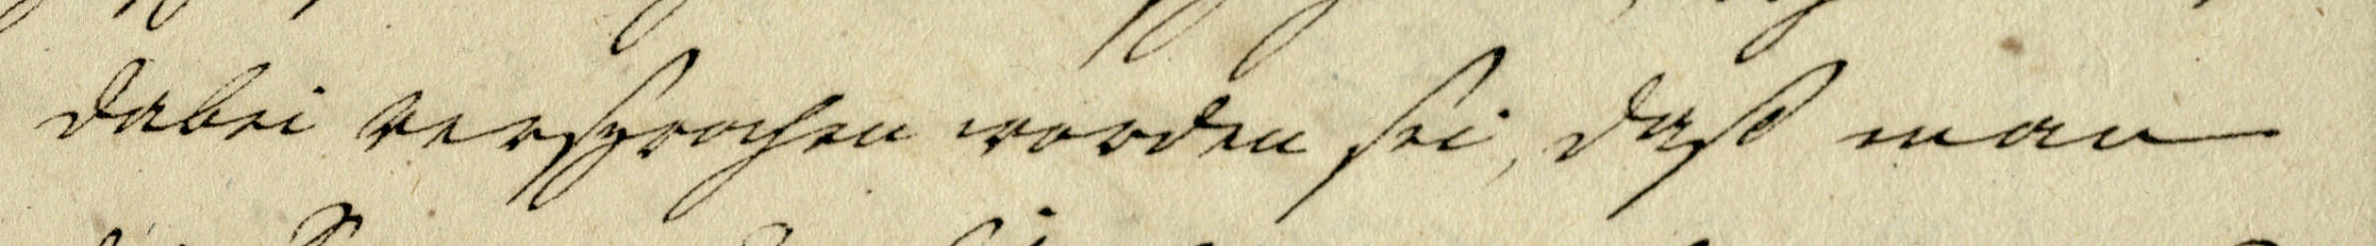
dabei versprochen worden sei, daß man
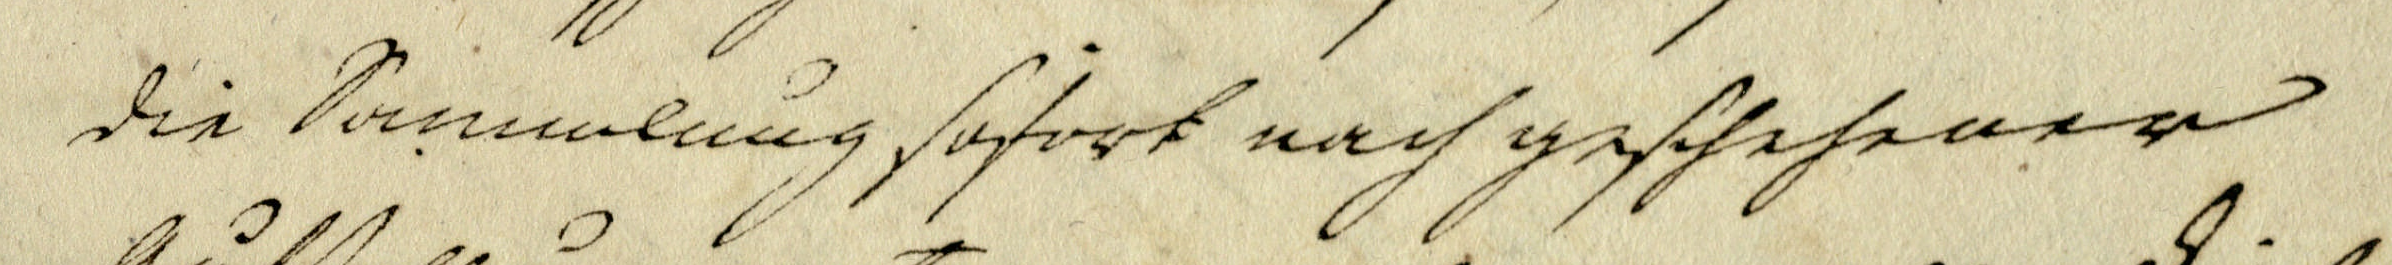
die Sammlung sofort nach geschehener
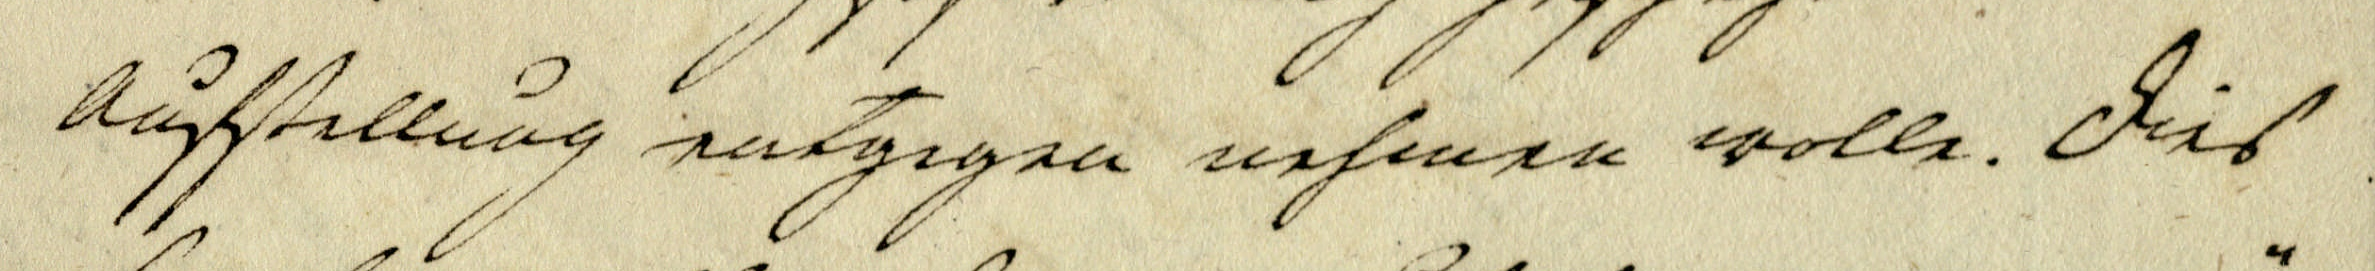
Aufstellung entgegen nehmen wolle. Dies
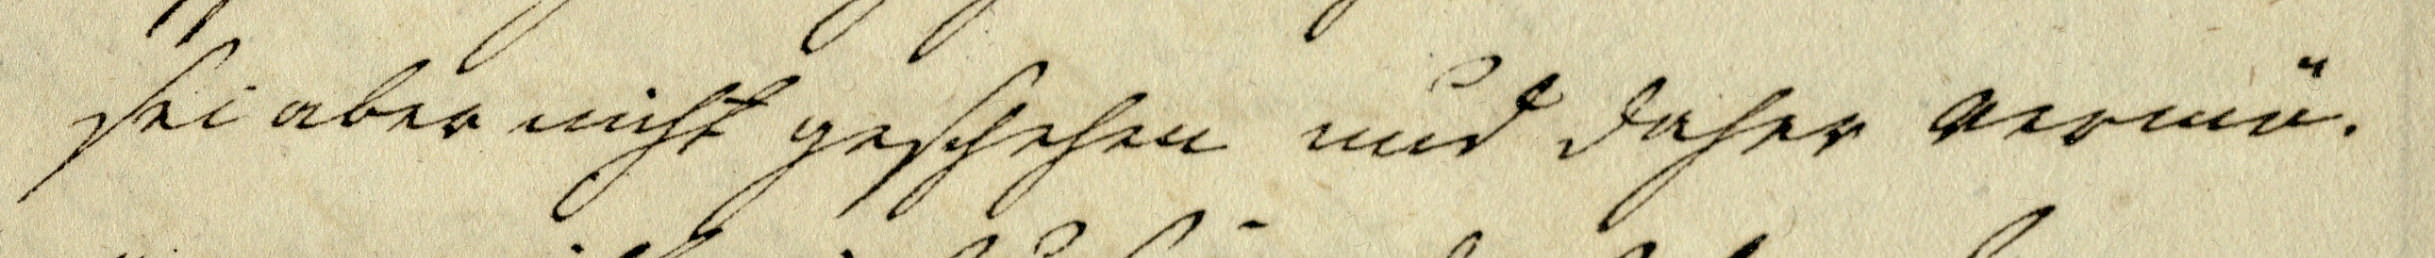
sei aber nicht geschehen und daher vermö¬
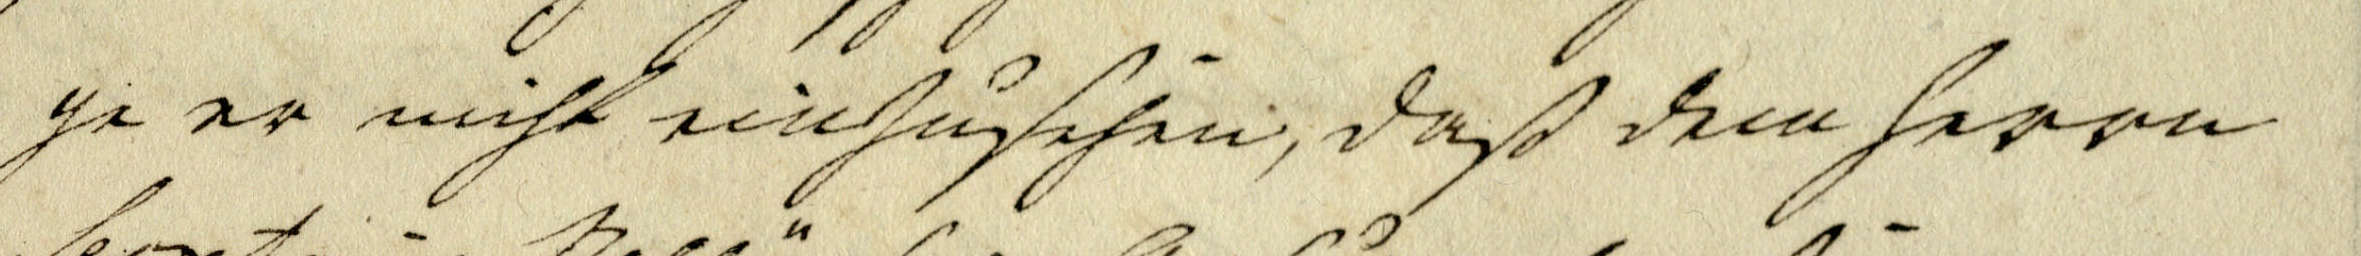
ge er nicht einzusehen, daß dem Herrn
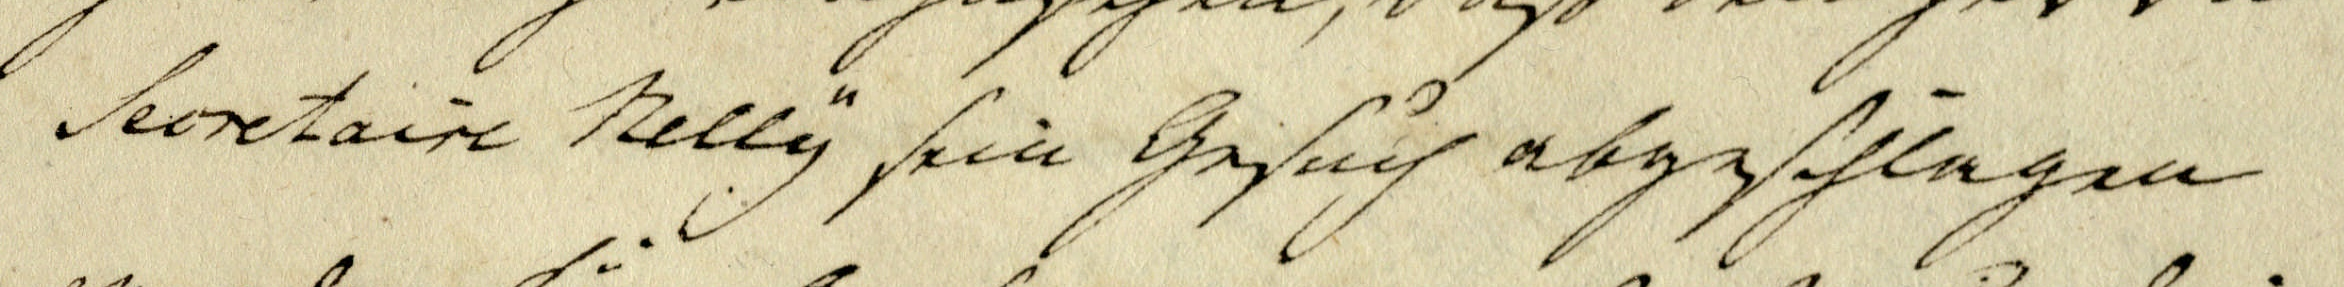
Secretaire Nellÿ sein Gesuch abgeschlagen
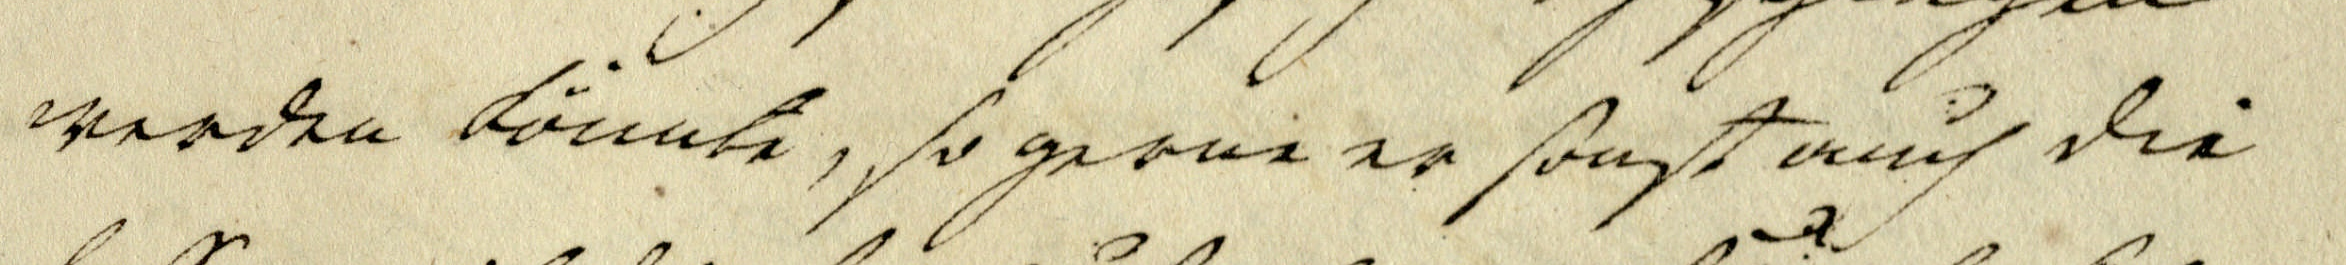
werden könnte, so gerne er sonst auch die
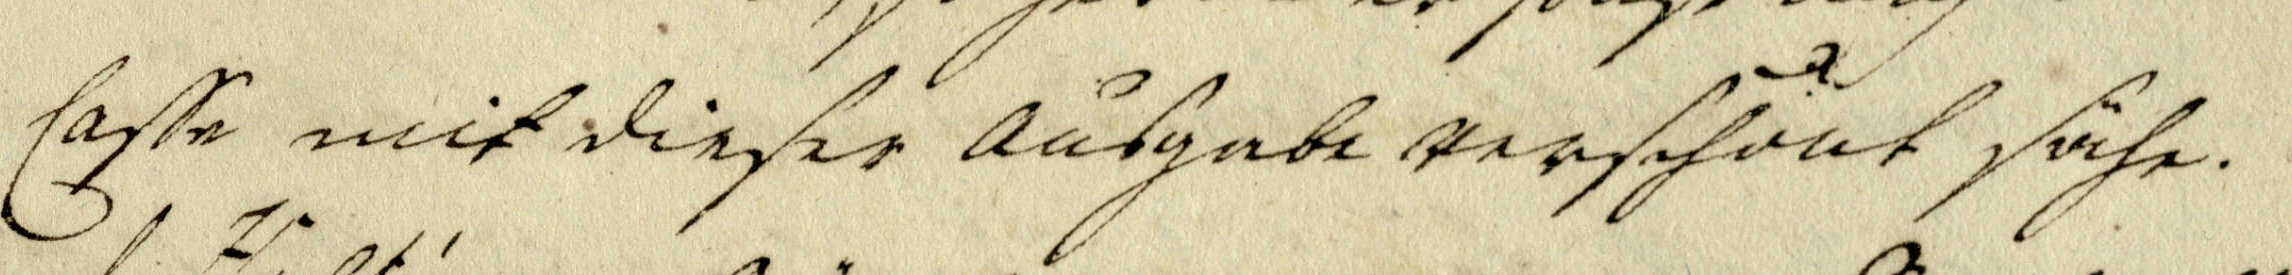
Casse mit dieser Ausgabe verschont sähe.
